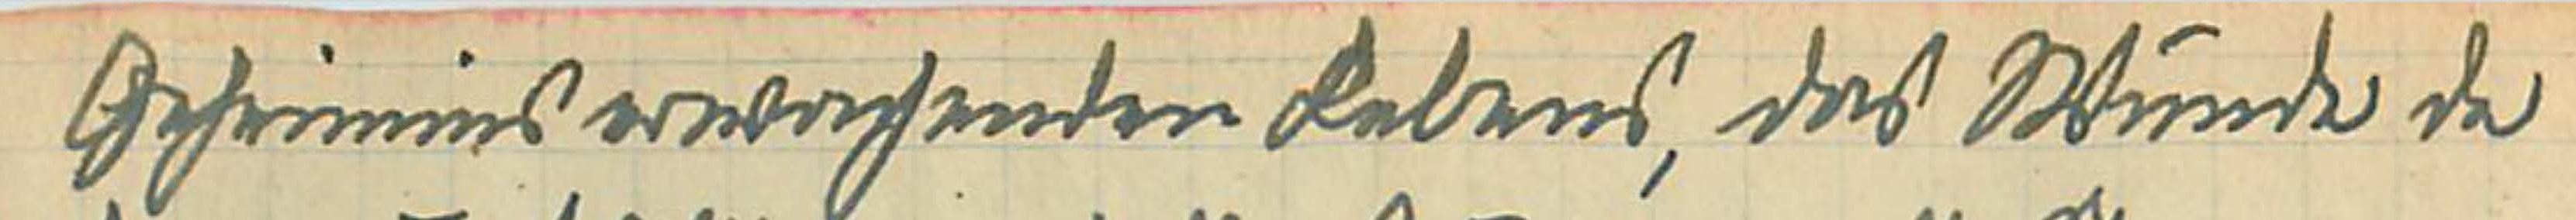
Geheimnis erwachenden Lebens, das Wunder der
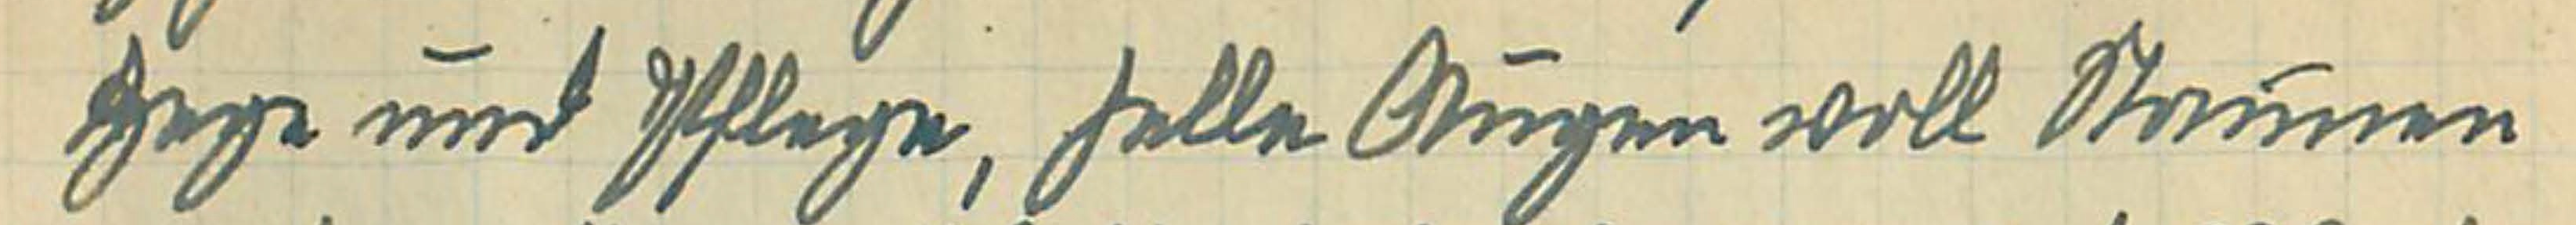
Hege und Pflege, helle Augen voll Staunen
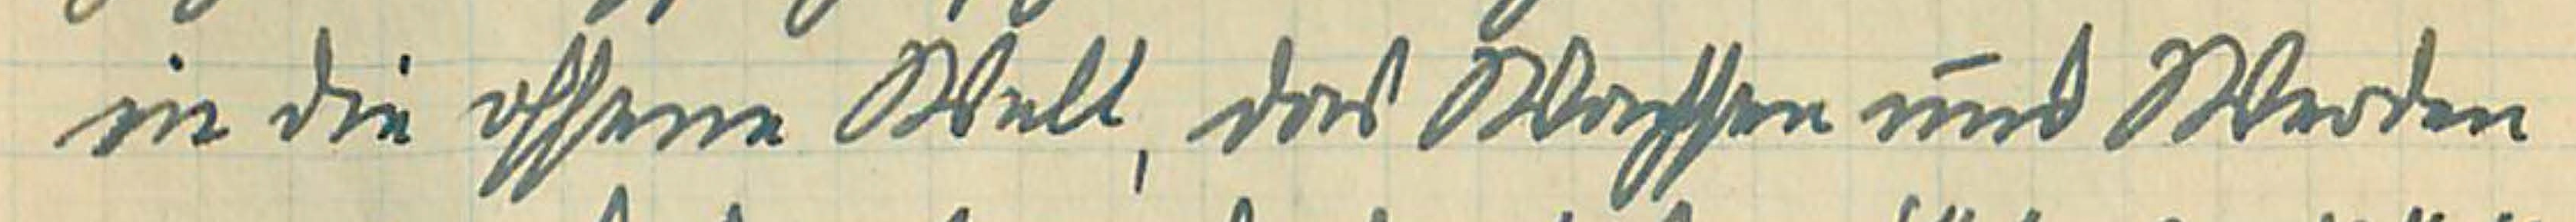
in die offene Welt, das Wachsen und Werden
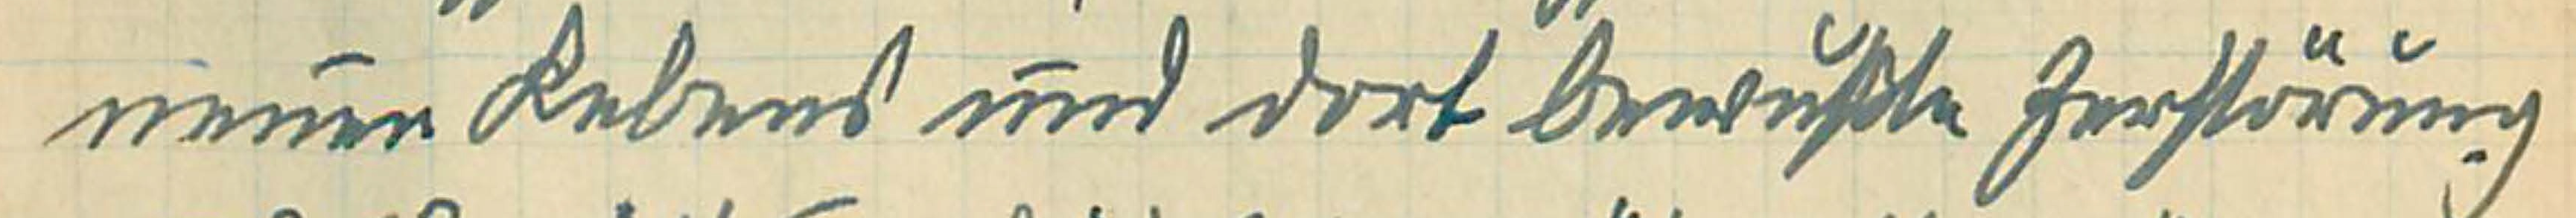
neuen Lebens und dort bewußte Zerstörung
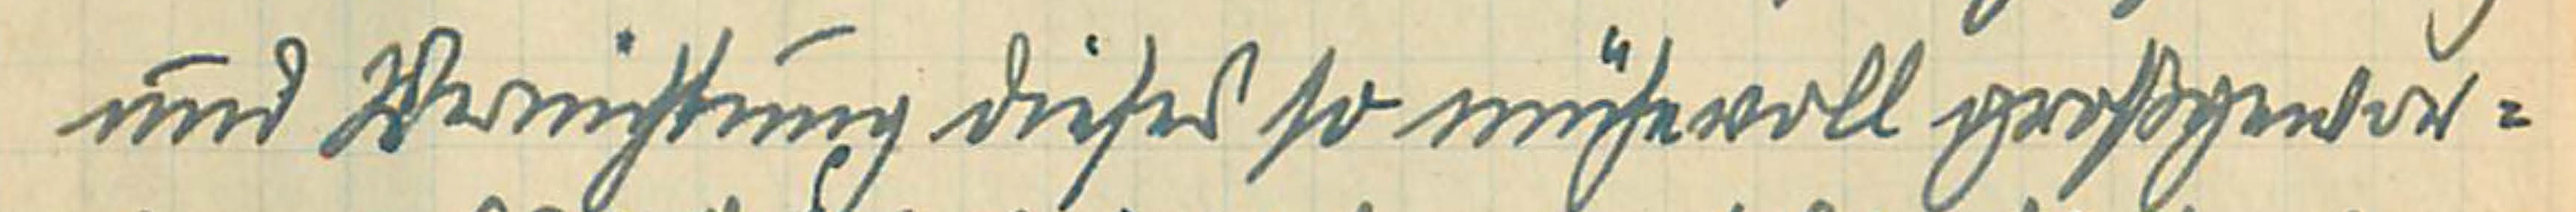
und Vernichtung dieses so mühevoll großgewor-
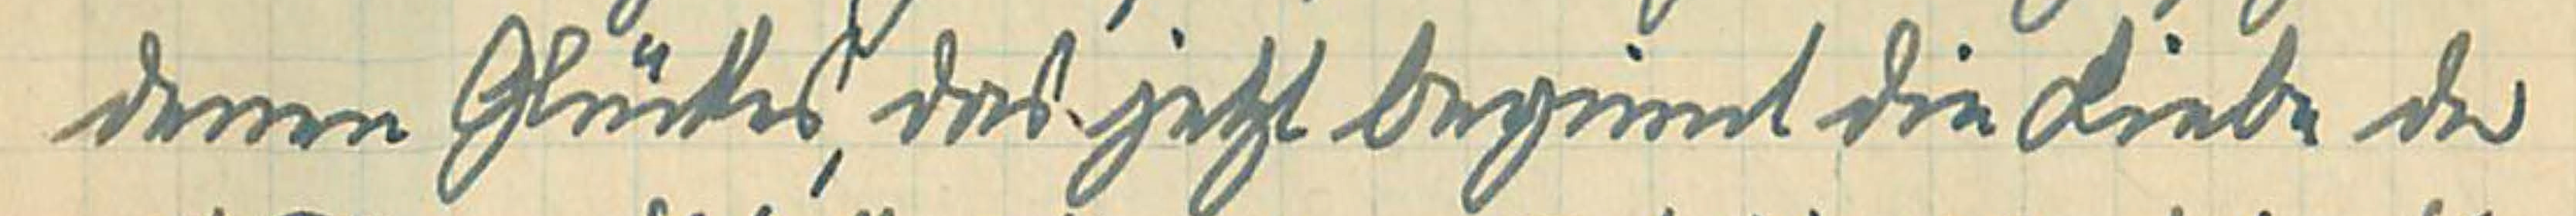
denen Glückes, das jetzt beginnt die Liebe der
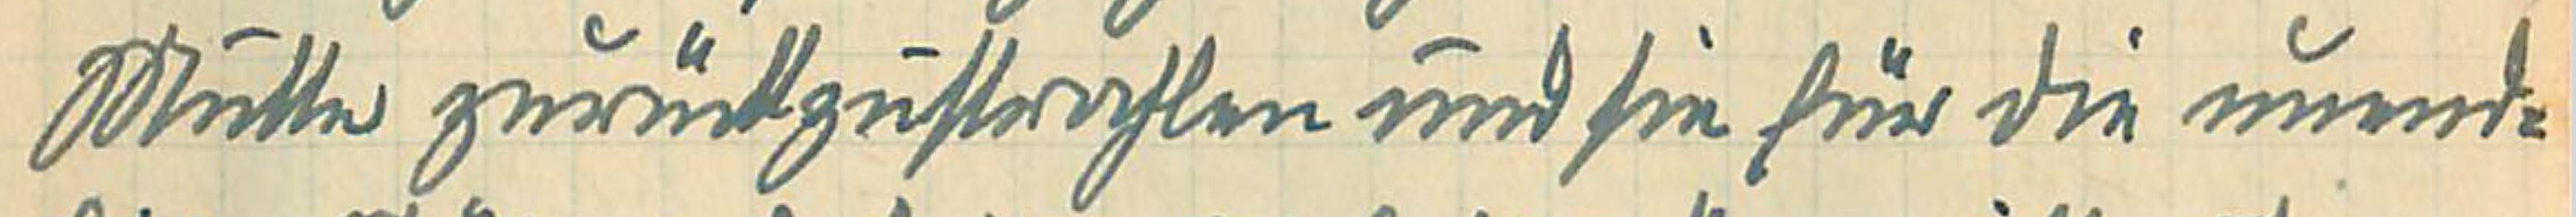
Mutter zurückzustrahlen und sie für die unend-
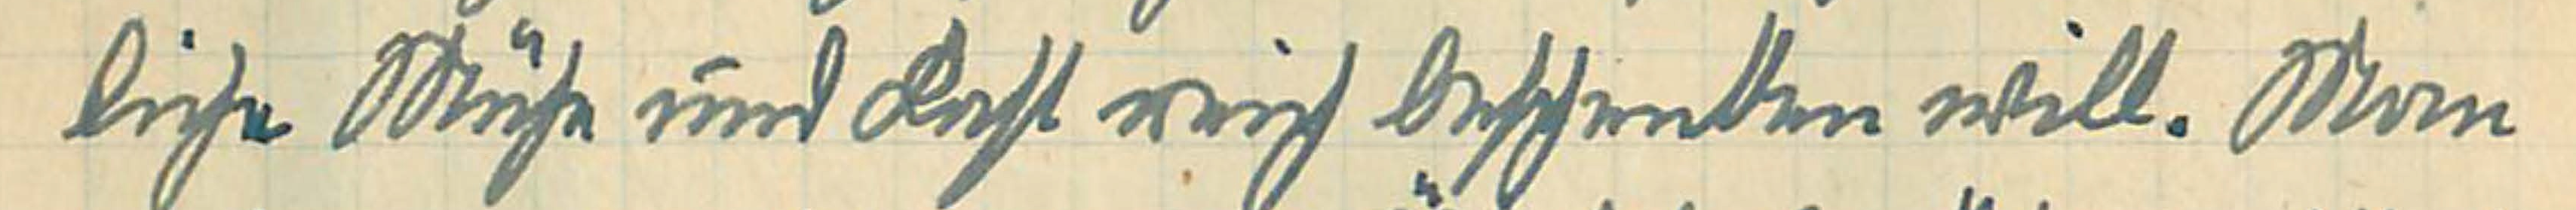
liche Mühe und Last reich beschenken will. Man
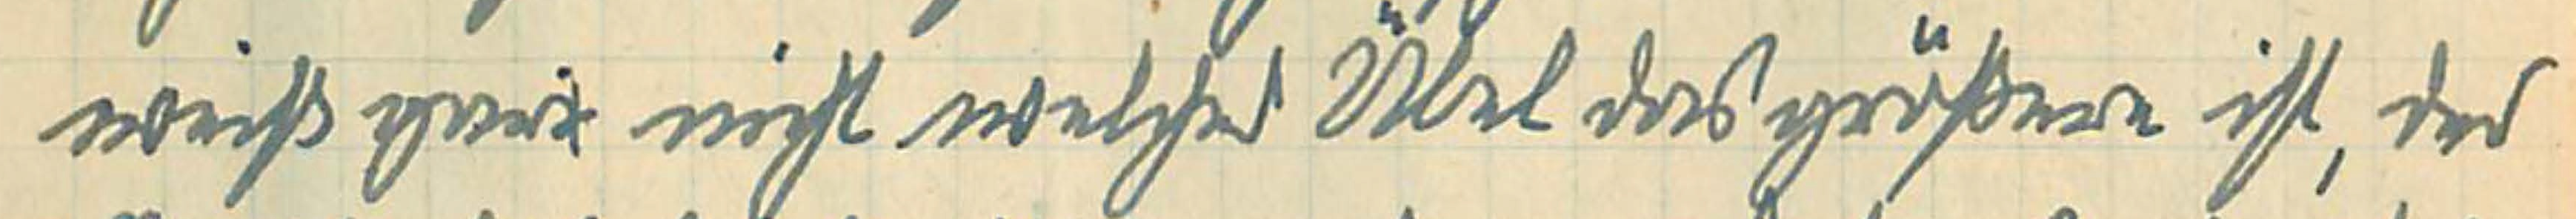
weiß gari nicht welches Übel das größere ist, der
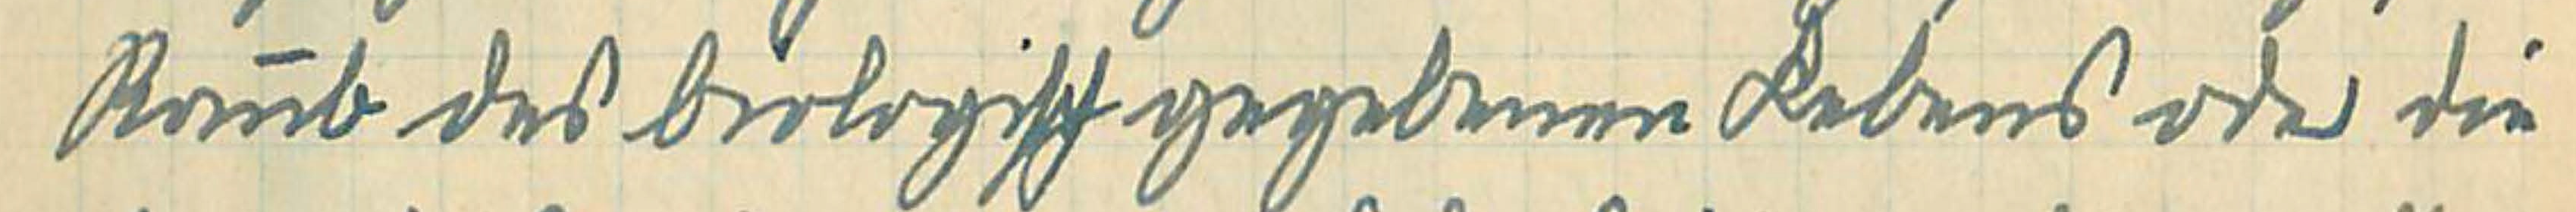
Raub des biologisch gegebenen Lebens oder die
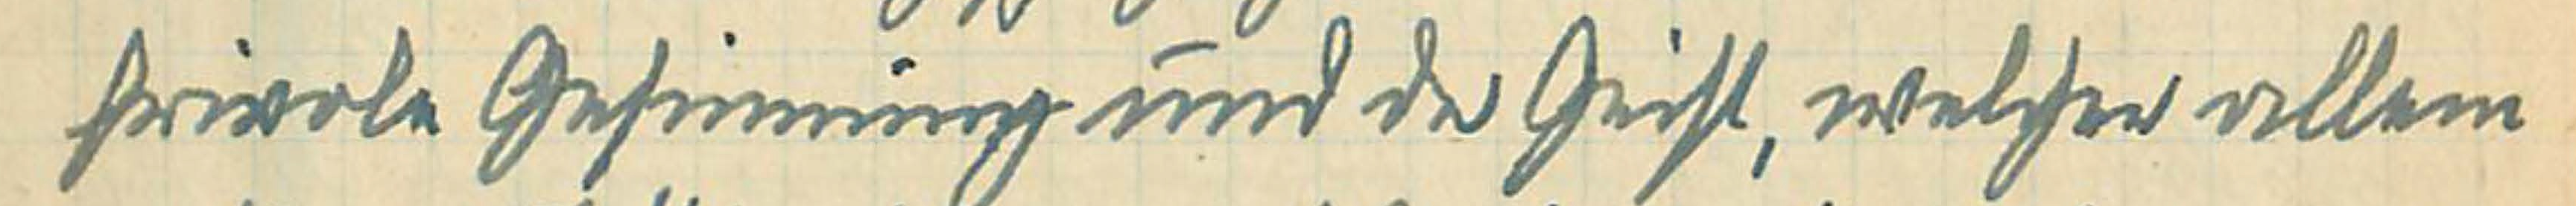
frivole Gesinnung und der Geist, welcher allem
